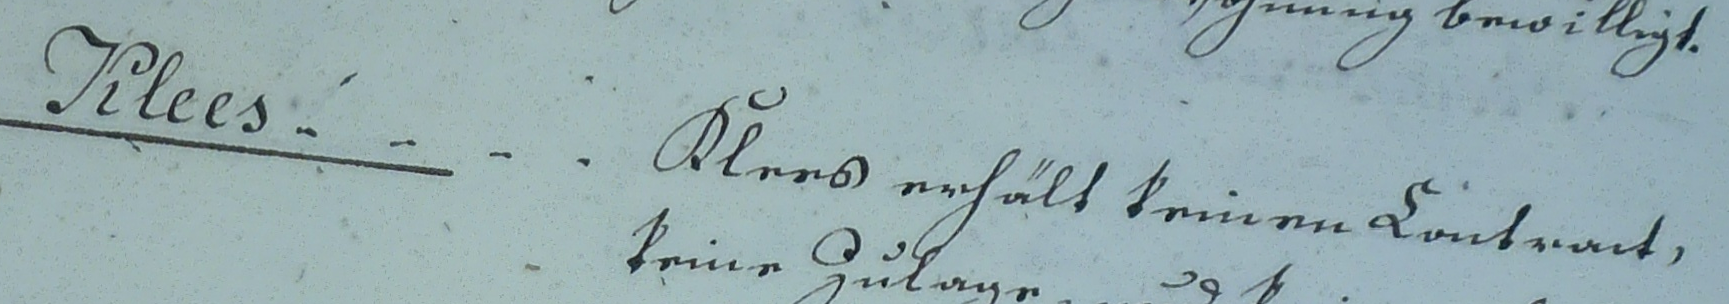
Klees .. .. .. .. Klees erhält keinen Contract,
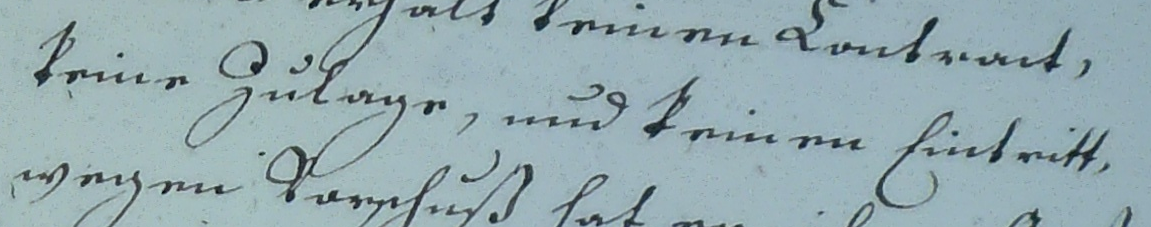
keine Zulage, und keinen Eintritt,
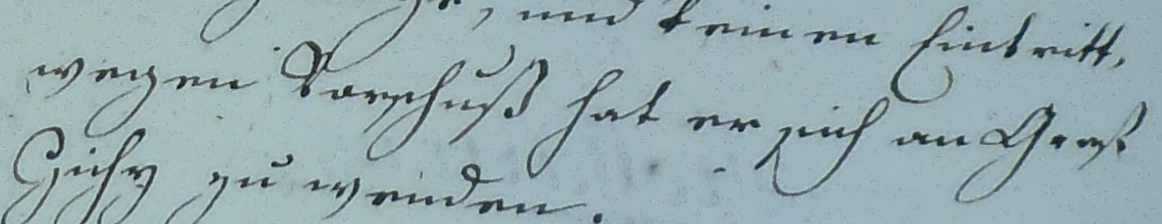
wegen Vorschuß hat er sich an Graf
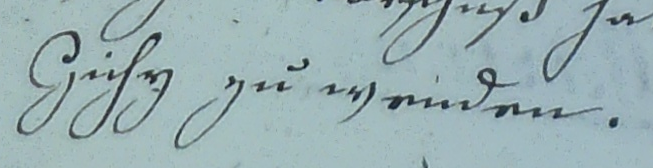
Zichy zu wenden.
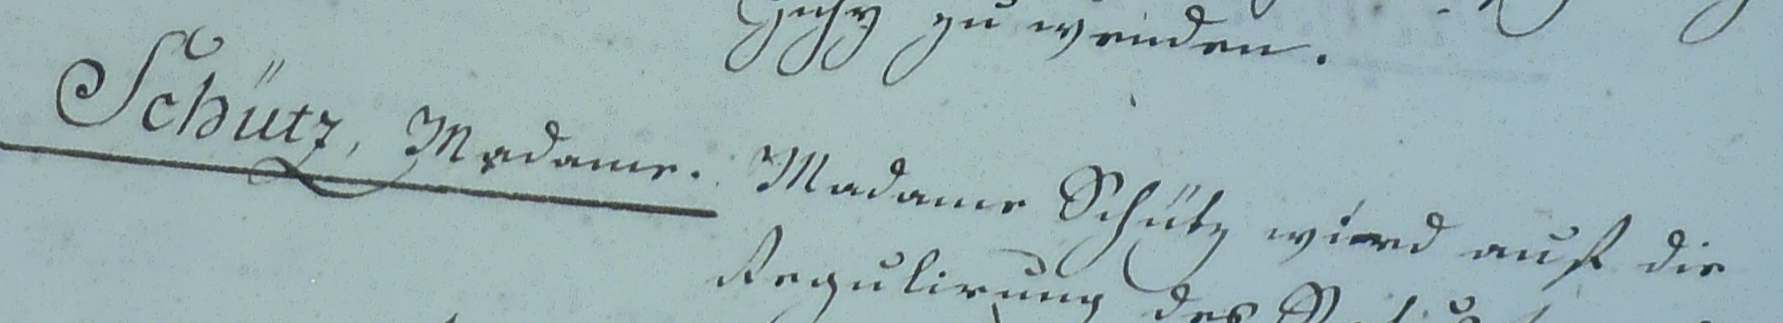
Schütz, Madame. Madame Schütz wird auf die
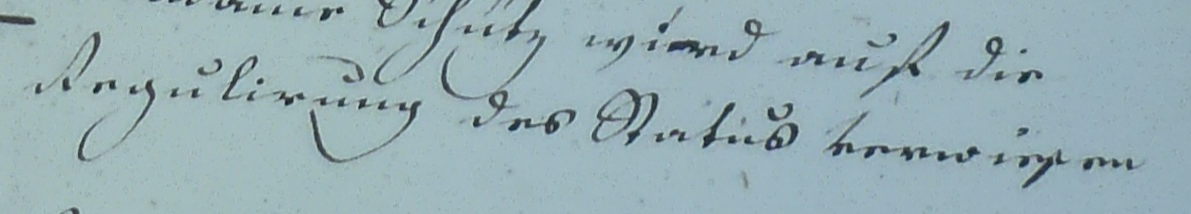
Regulirung des Status verwiesen
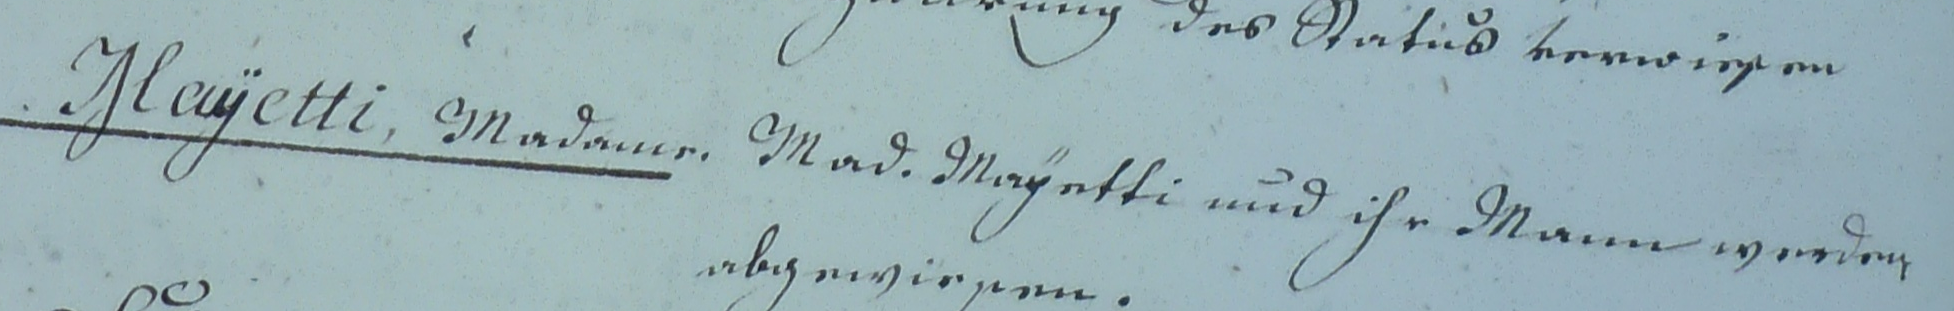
Maÿetti, Madame. Mad. Maÿetti und ihr Mann werden
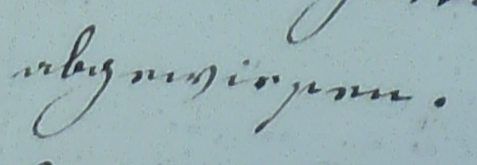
abgewiesen.
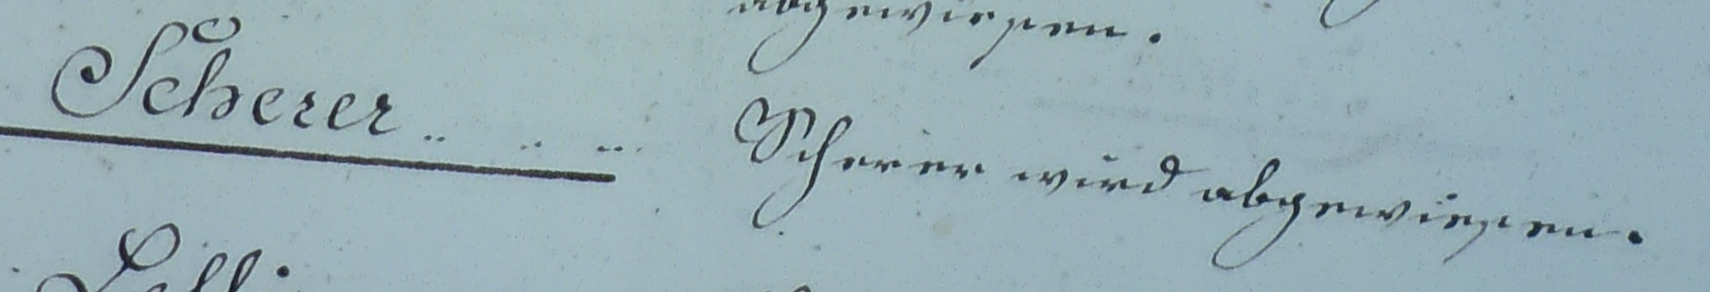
Scherer .. .. .. Scherer wird abgewiesen.
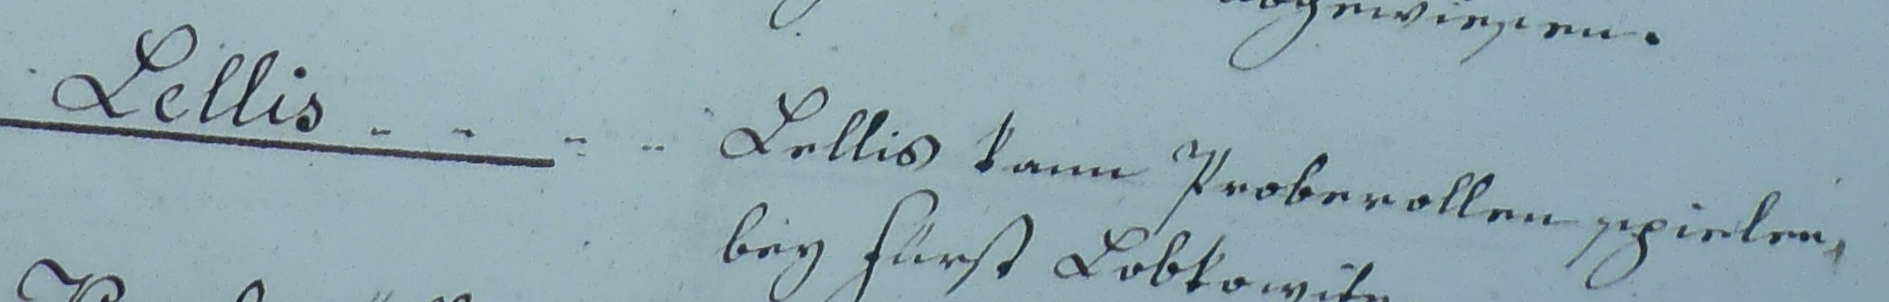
Lellis .. .. .. .. Lellis kann Proberollen spielen,
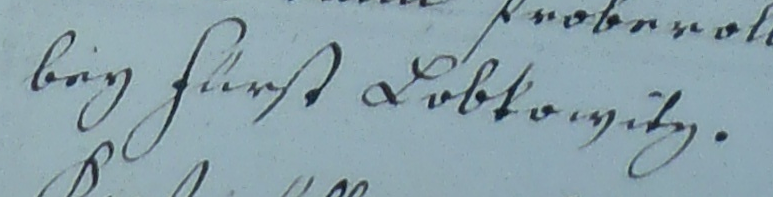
bey Fürst Lobkowitz.
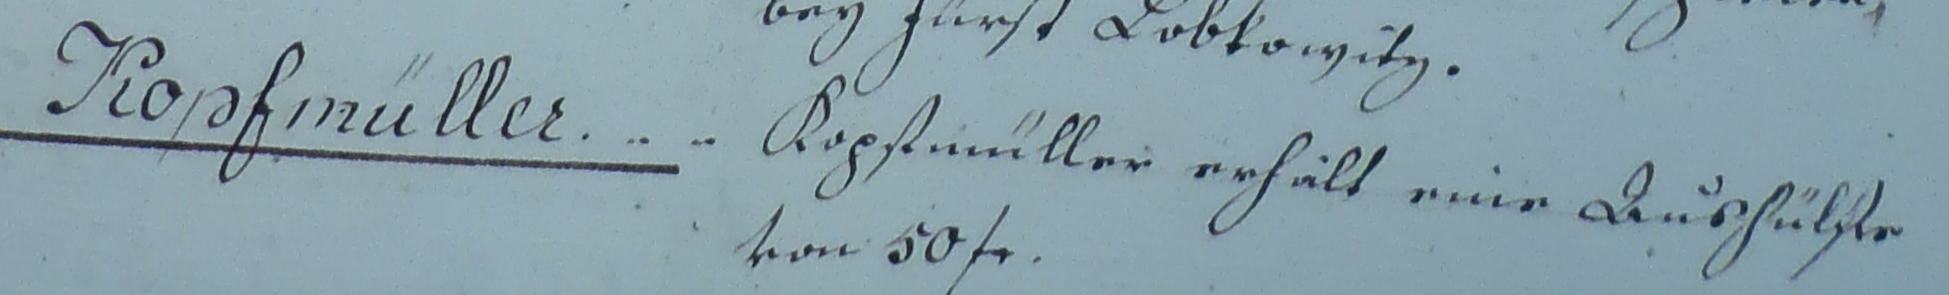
Kopfmüller. .. .. Kopfmüller erhält eine Aushülfe
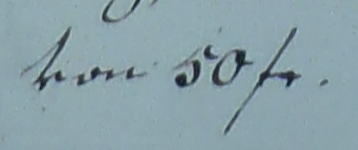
von 50 fr.
